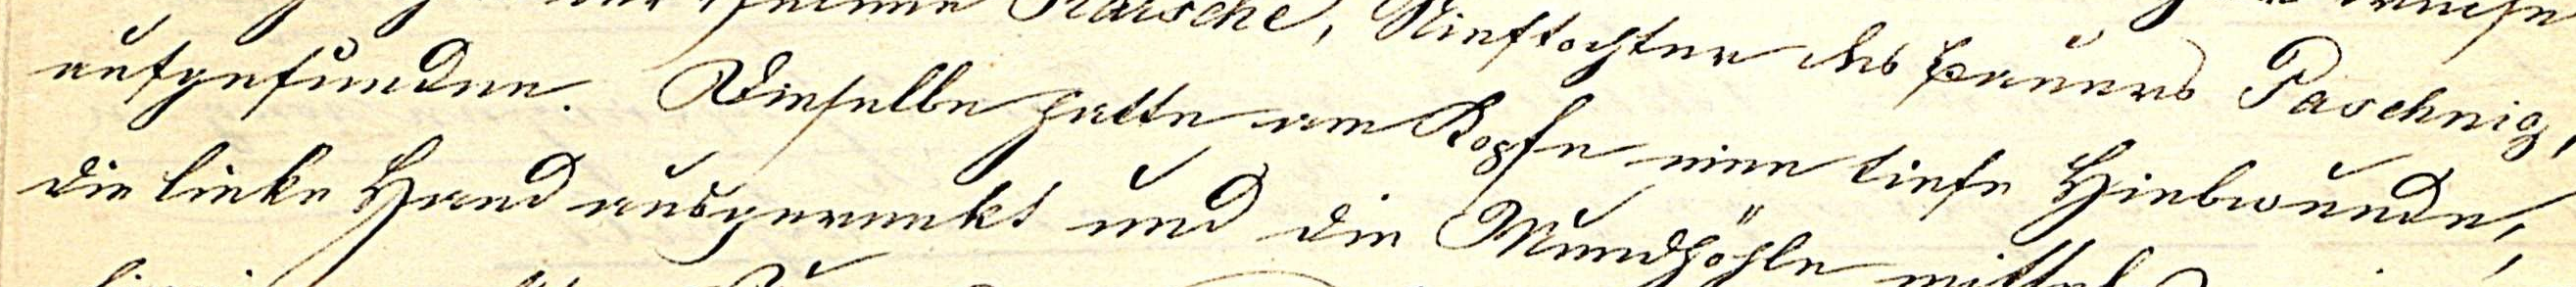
aufgefunden. Dieselbe hatte am Kopfe eine tiefe Hiebwunde,
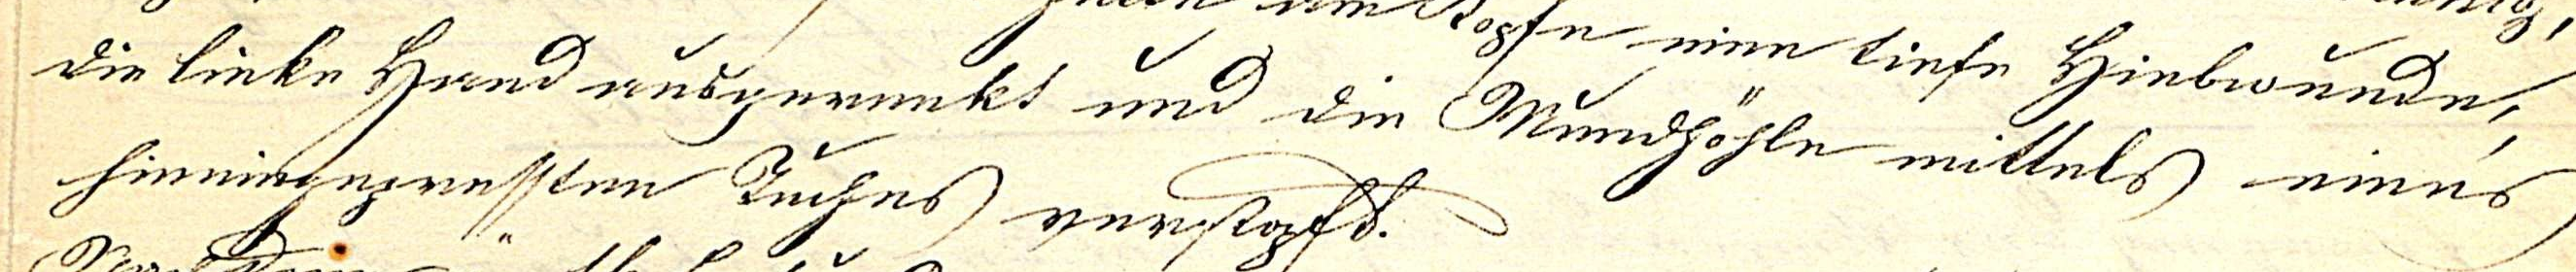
die linke Hand ausgereckt und die Mundhöhle mittels eines
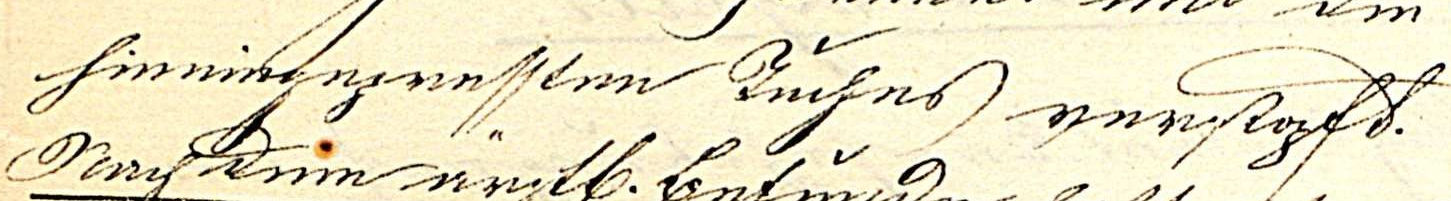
hineingepressten Tuches verstopft.
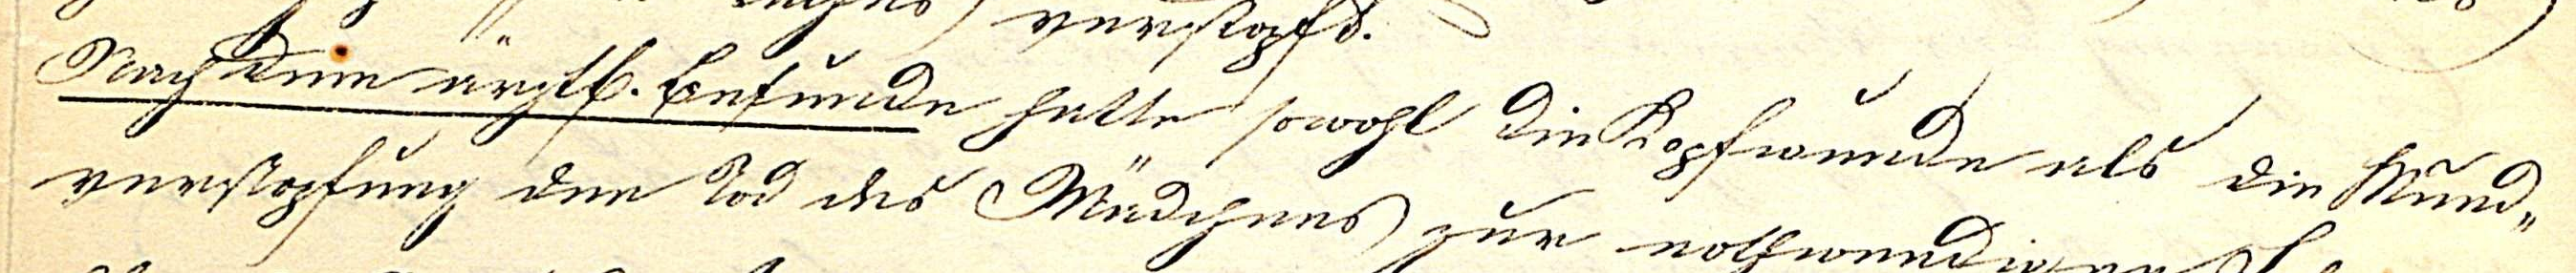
Nach dem ärztl. Befunde hatte sowohl die Kopfwunde als die Mund¬
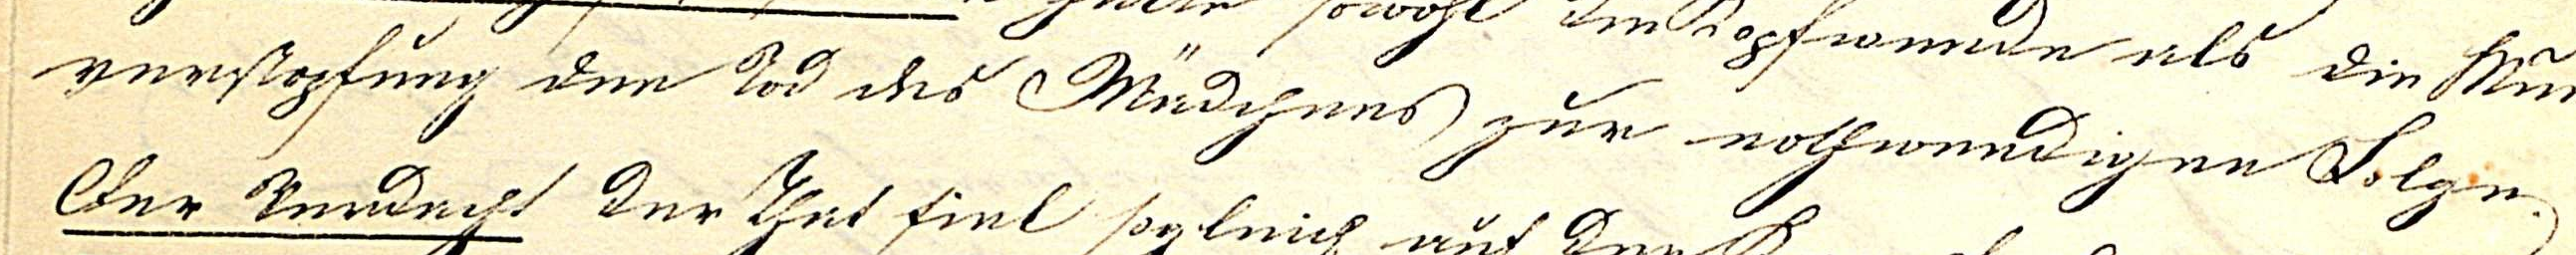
verstopfung den Tod des Mädchens zur notwendigen Folge.
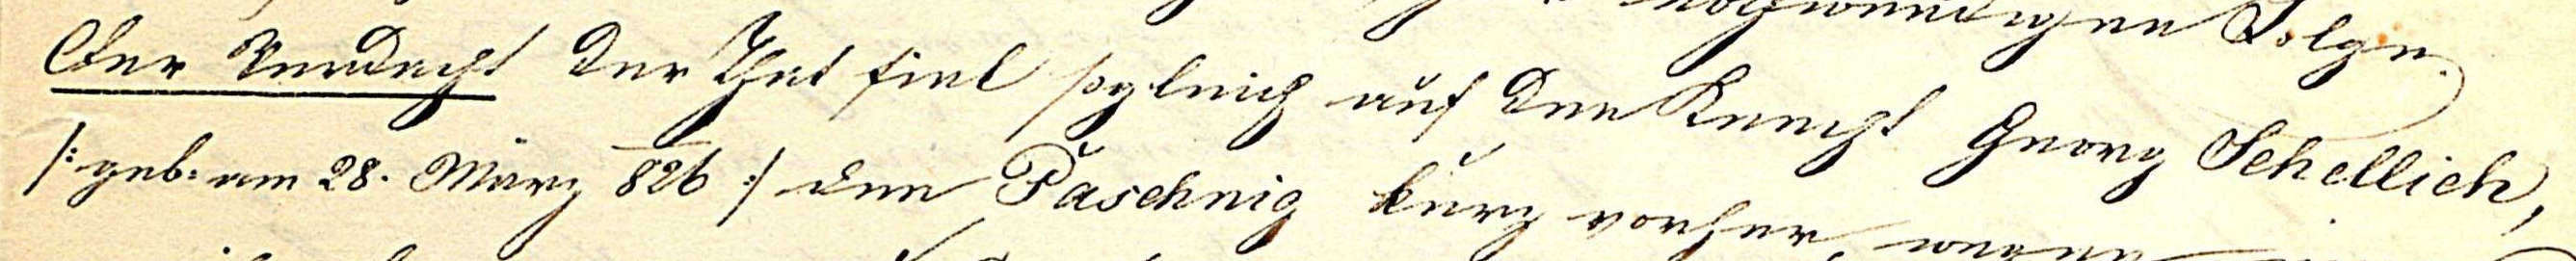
Der Verdacht der That fiel sogleich auf den Knecht Georg Schellich,
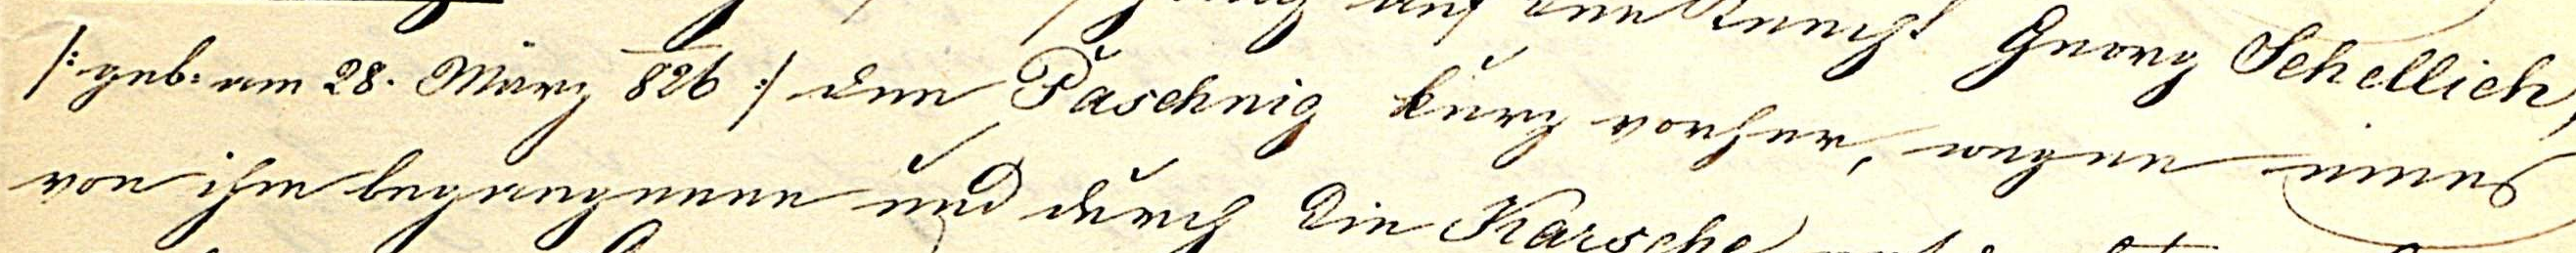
(geb. am 28. März 826) den Paschnig kurz vorher, wegen eines
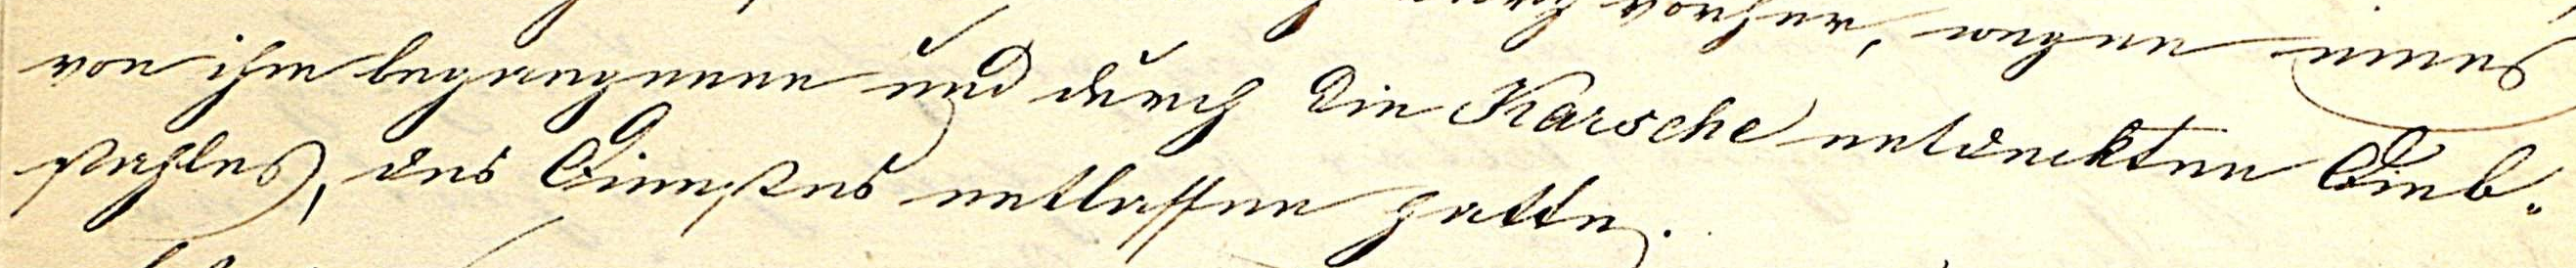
von ihm begangenen und durch die Karsche entdeckten Dieb¬
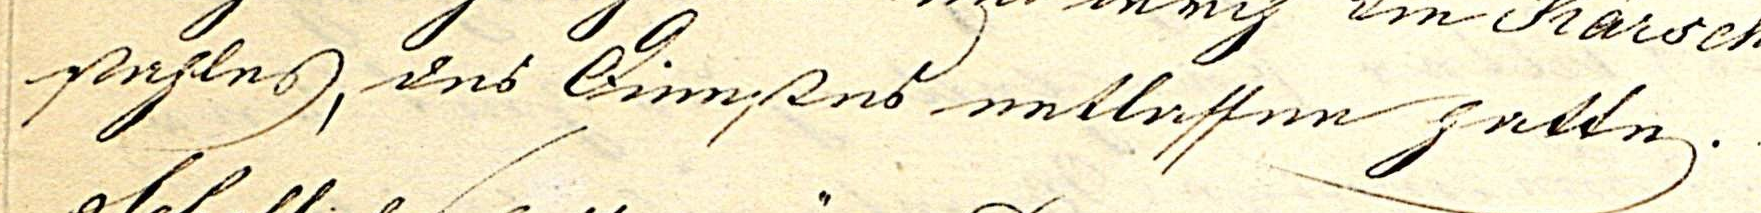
stahles, des Dienstes entlassen hatte.
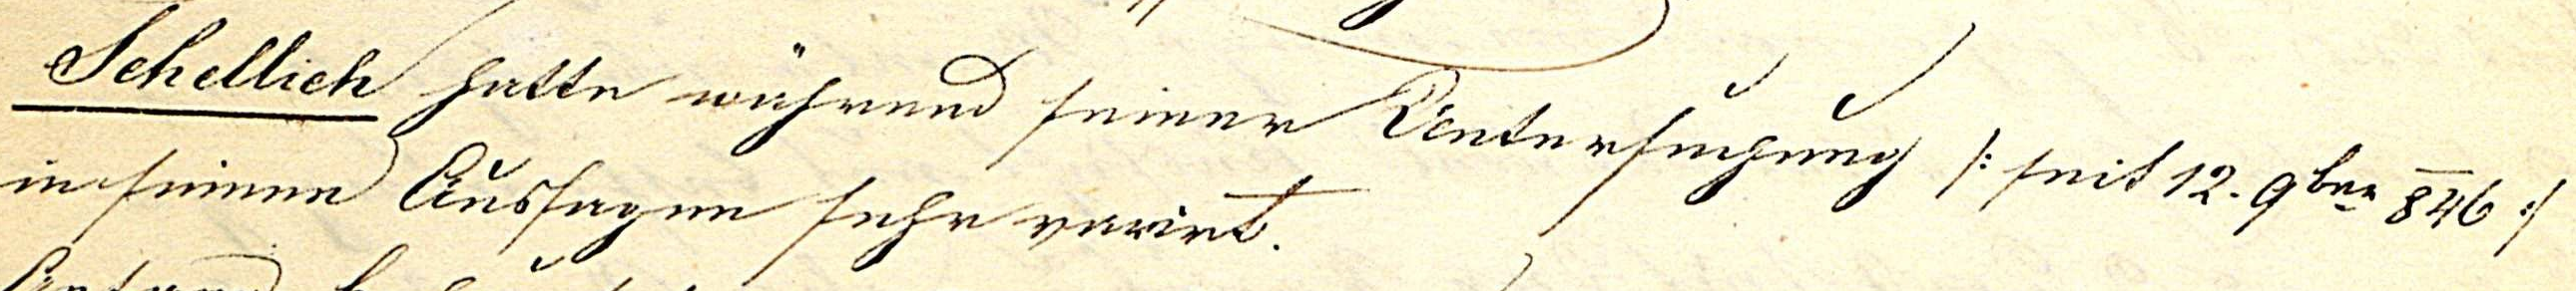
Schellich hatte während seiner Untersuchung (seit 12. 9ber 846)
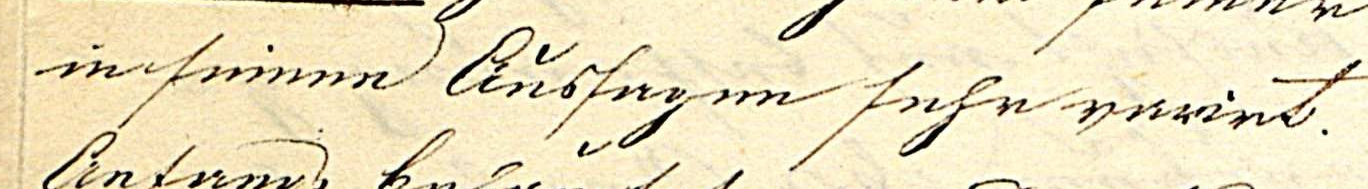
in seinen Aussagen sehr varirt.
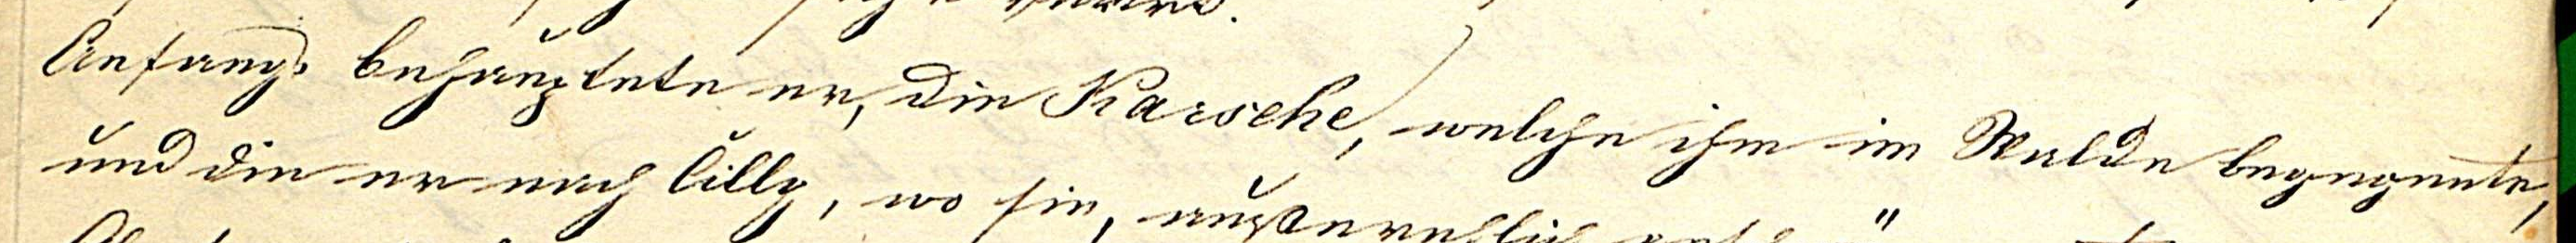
Anfangs behauptete er, die Karsche, welche ihm im Walde begegnete,
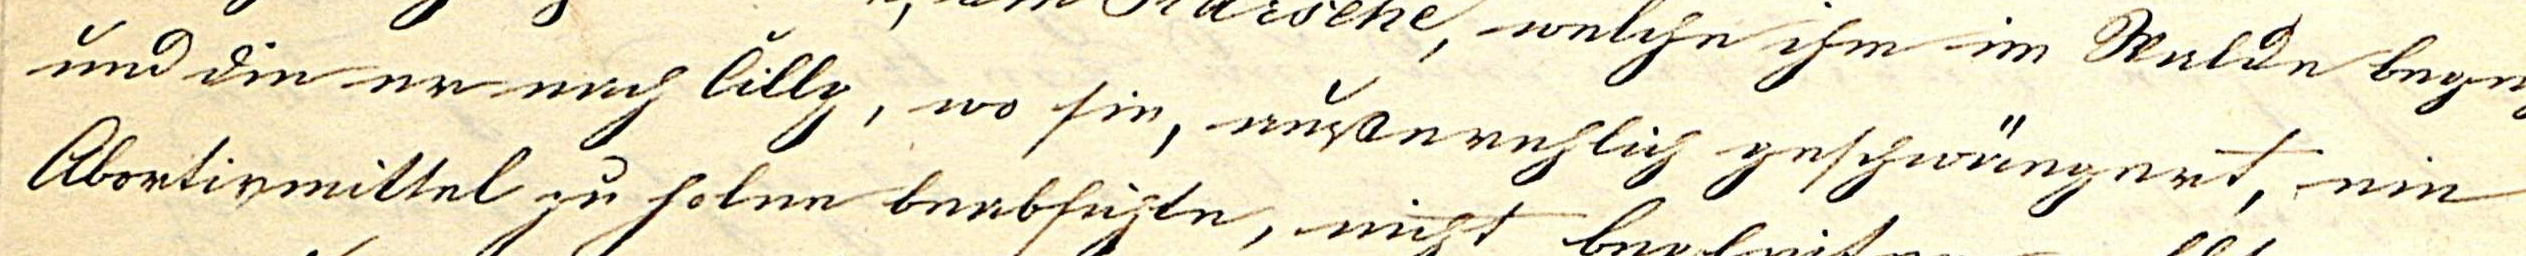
und die er nach Čilly, wo sie, außerehlich geschwängert, ein
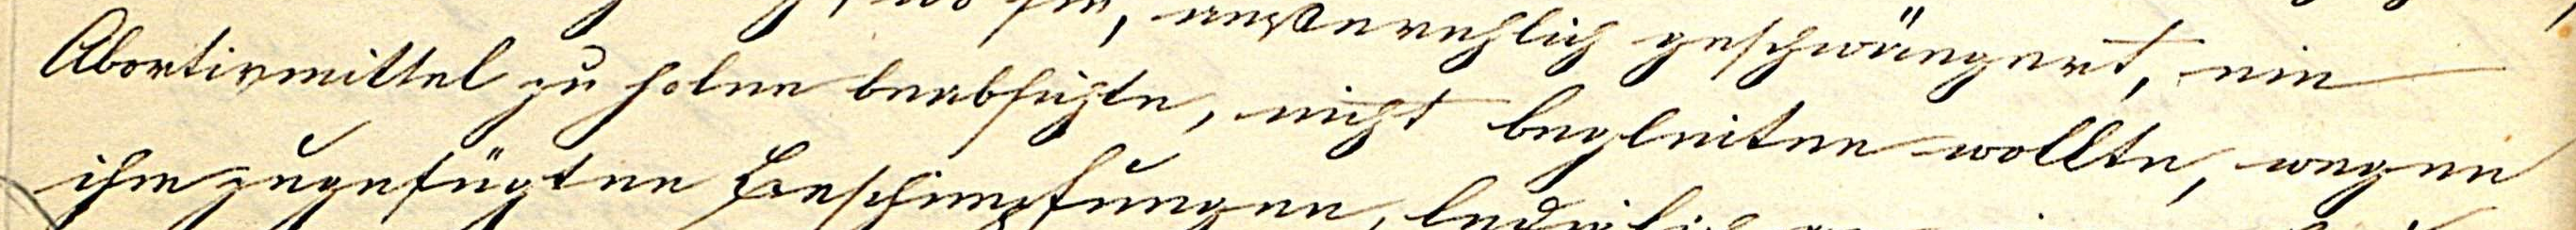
Abortirmittel zu holen beabsichte, nicht begleiten wollte, wegen
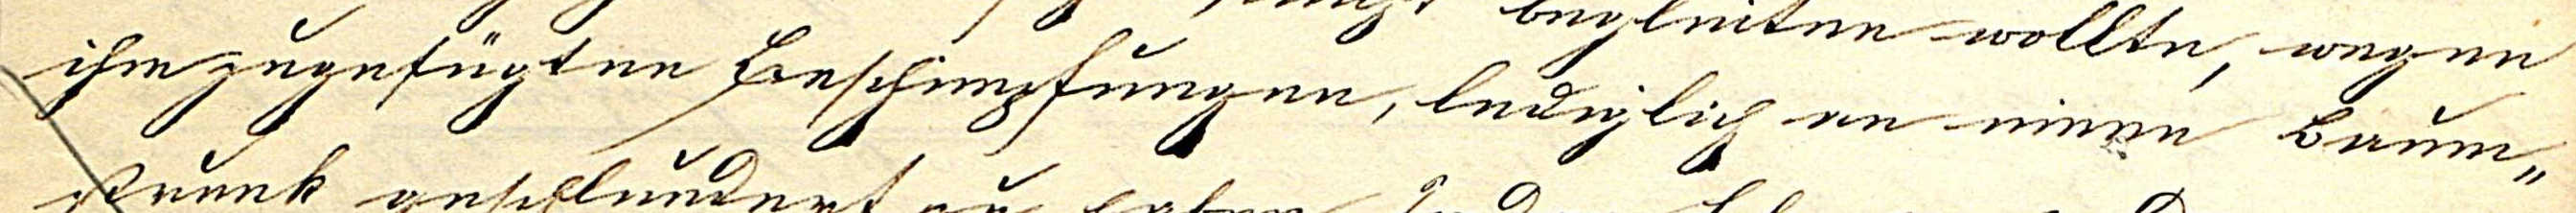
ihm zugefügten Beschimpfungen, lediglich an einen Baum¬
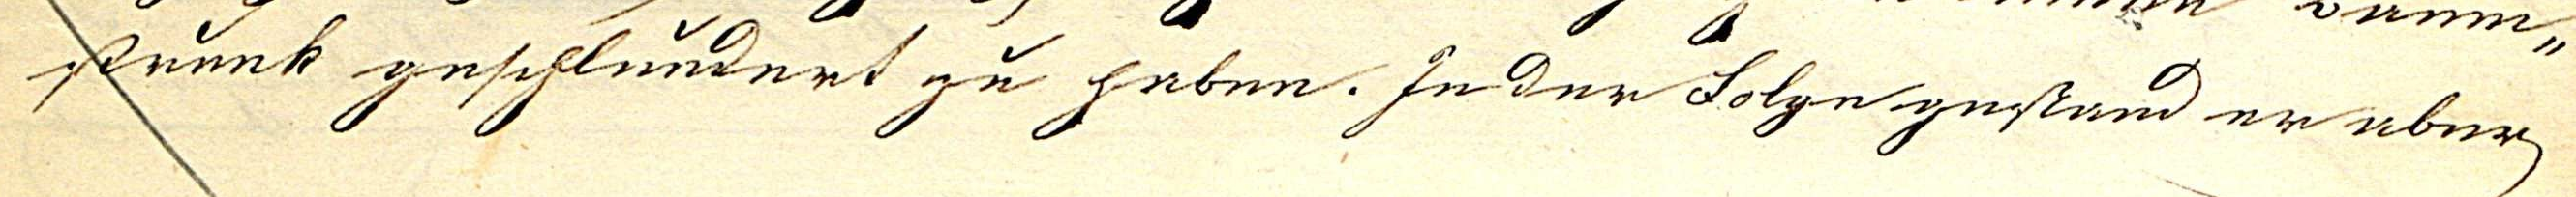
strunk geschleudert zu haben. In der Folge gestand er aber
